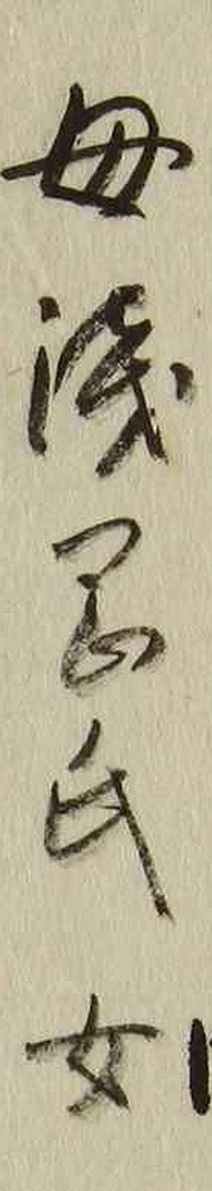母浅岡氏女
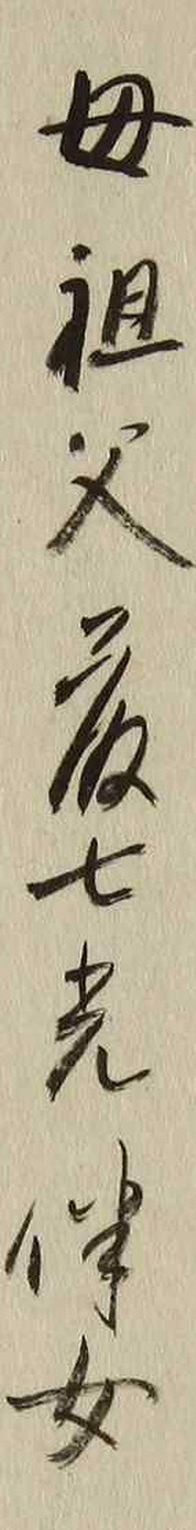母祖父藤七光伴女
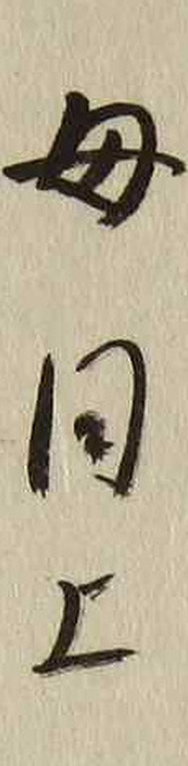母同上
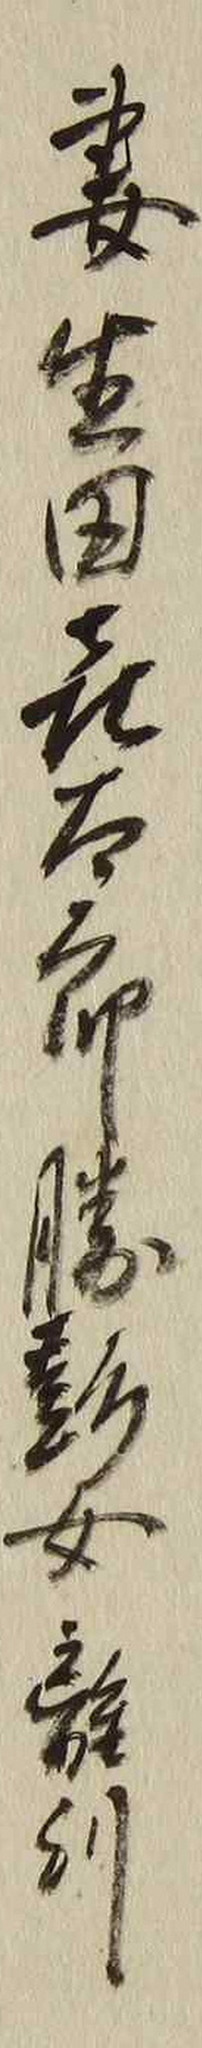妻生田喜太郎勝彭女離別
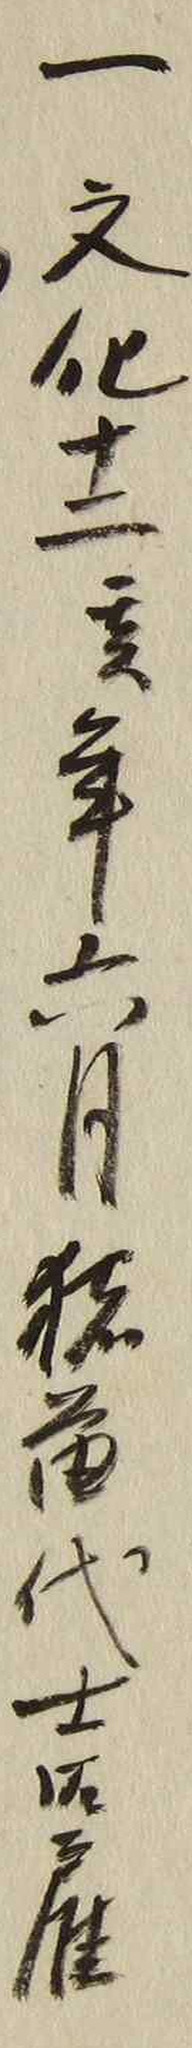一文化十二亥年六月猪苗代士御雇
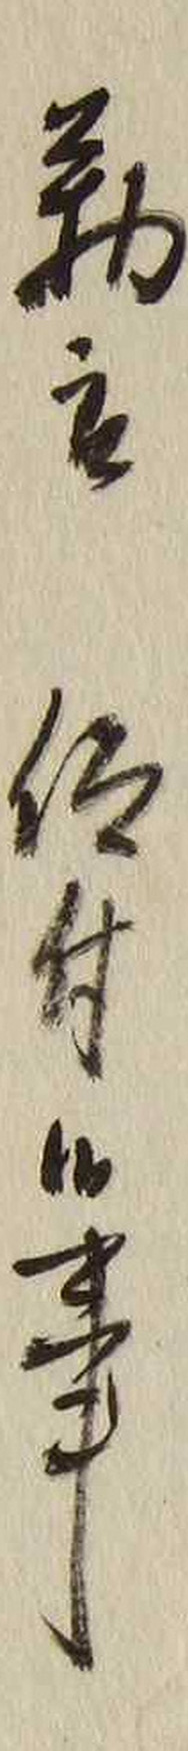勤被仰付候事
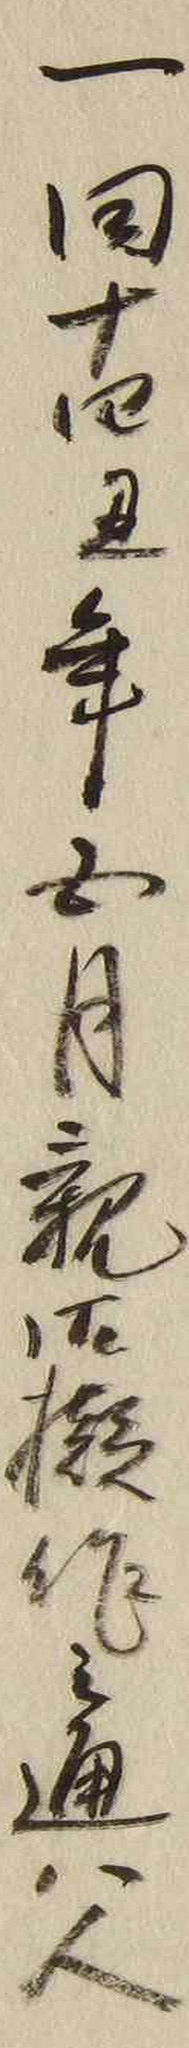一同十四丑年五月親御擬作之通

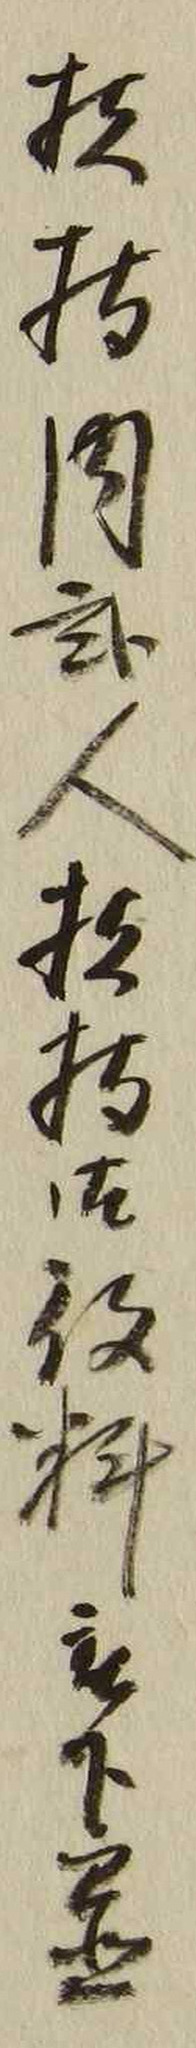扶持内弐人扶持御役料被下置
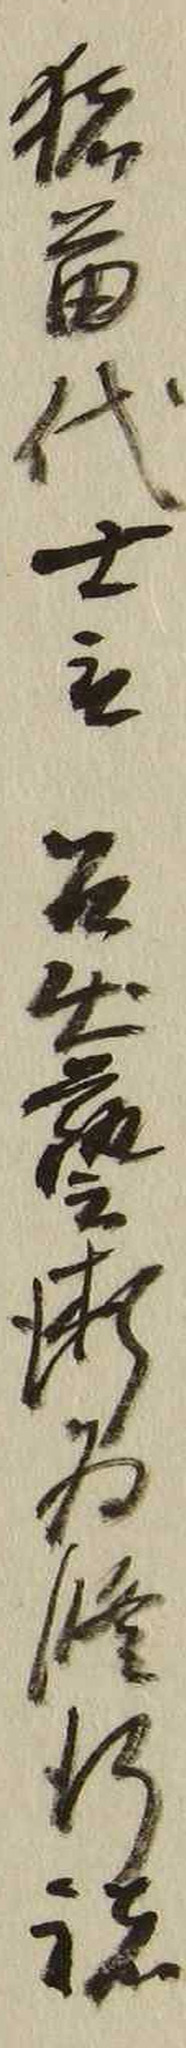猪苗代士被召出芸術為修行諸
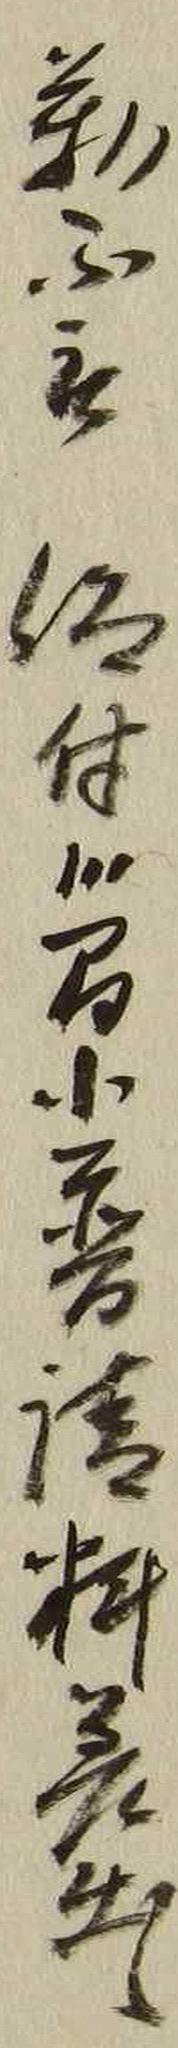勤不被仰付候間小普請料差出候
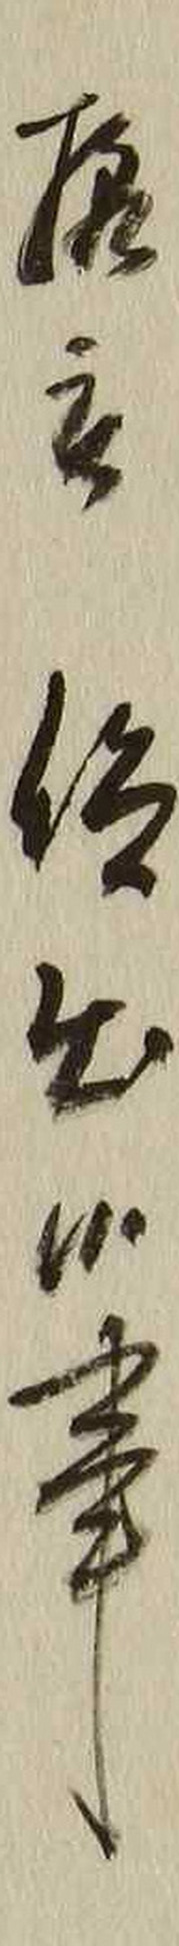様被仰出候事
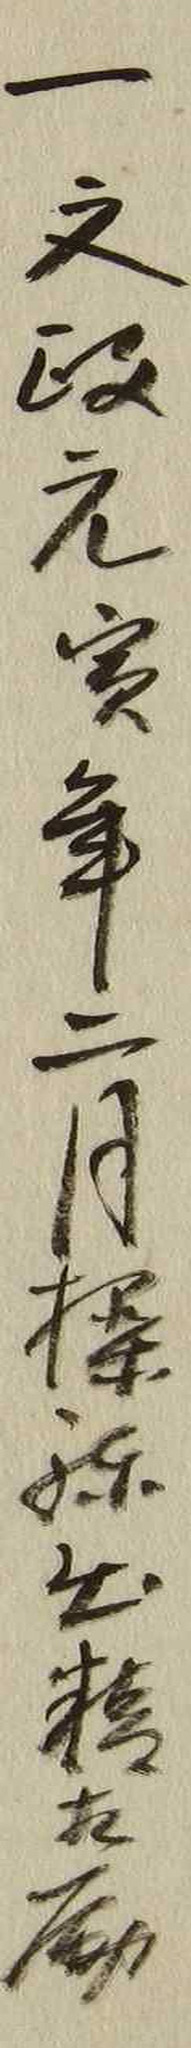一文政元寅年二月操練出精相励
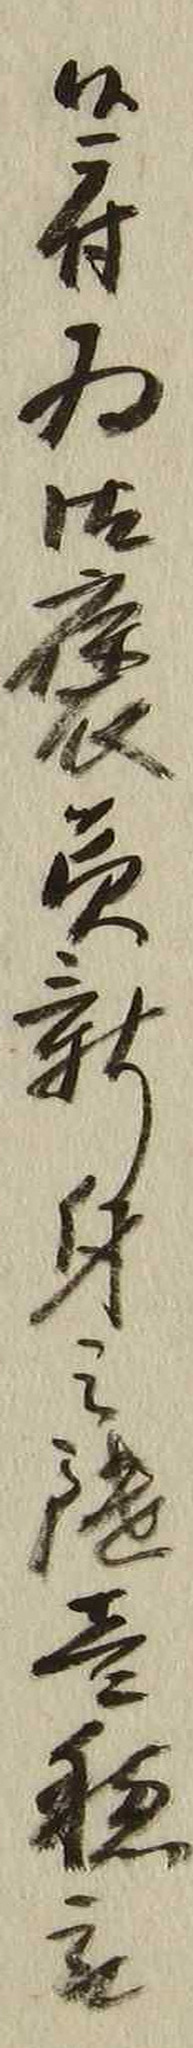候に付為御褒美新身之鑓壱穂被
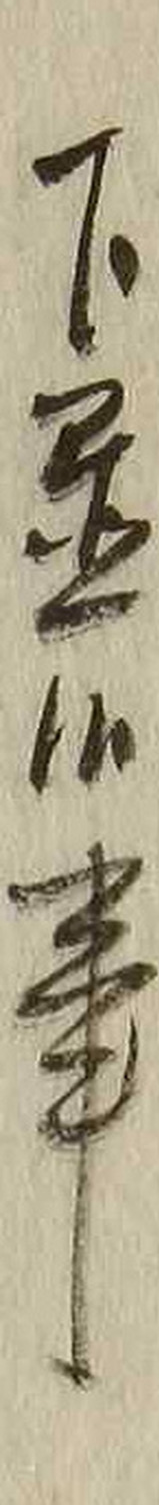下置候事
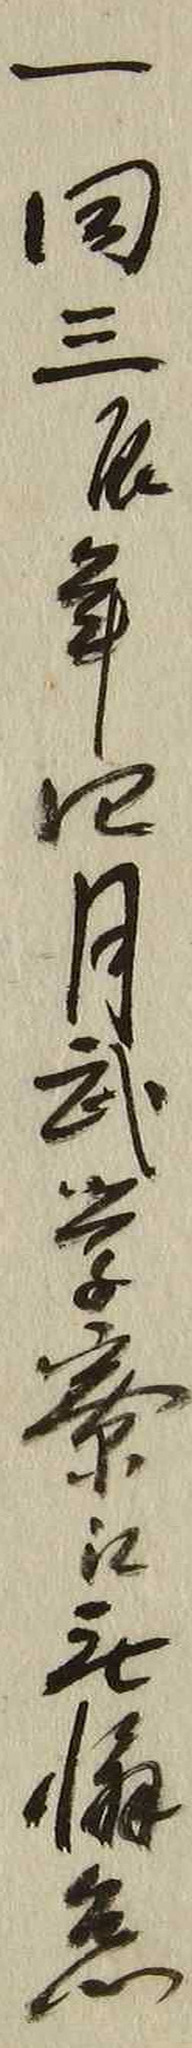一同三辰年四月武学寮江無懈怠
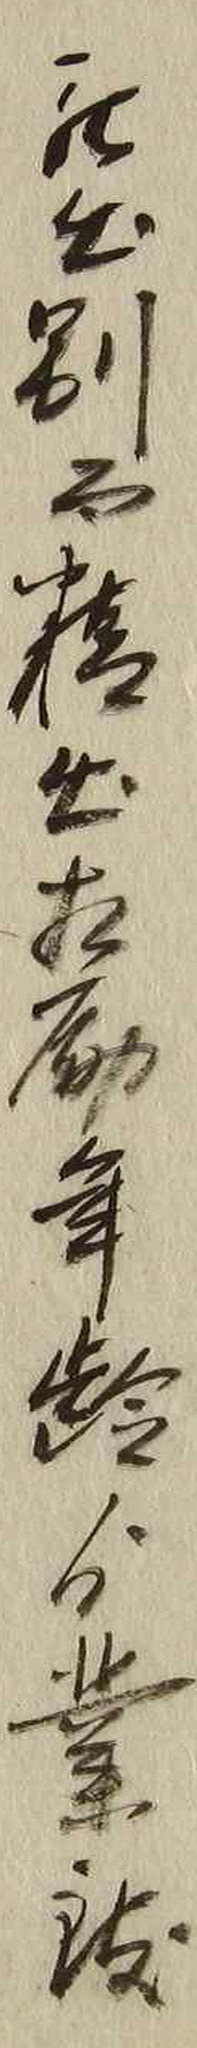罷出別而精出相励年齢ゟ業致
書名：諸士系譜　巻之360　す之部10
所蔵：会津若松市立会津図書館
